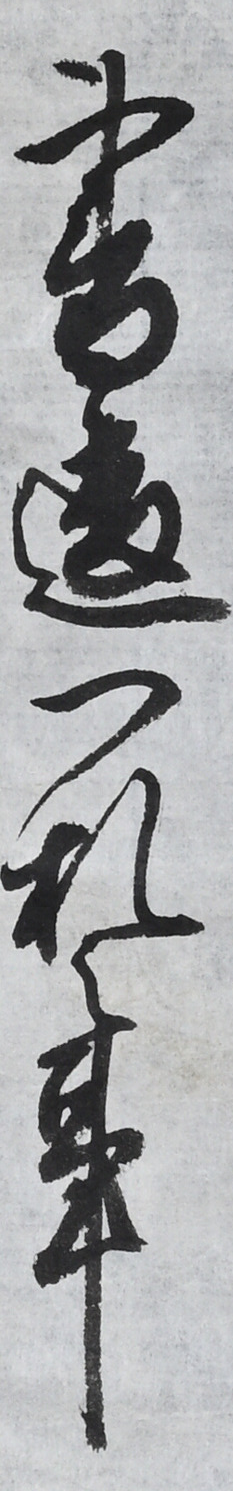書違一札之事
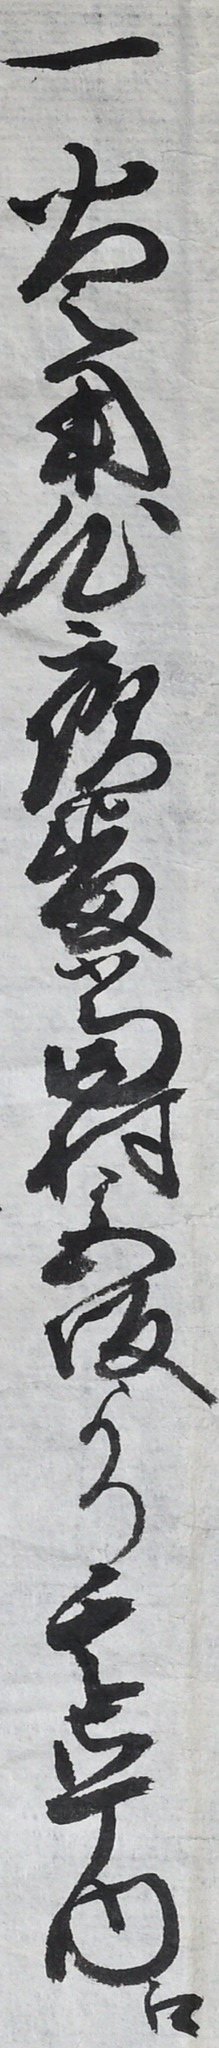一火之用心夜番当村宮坂より其御町内え
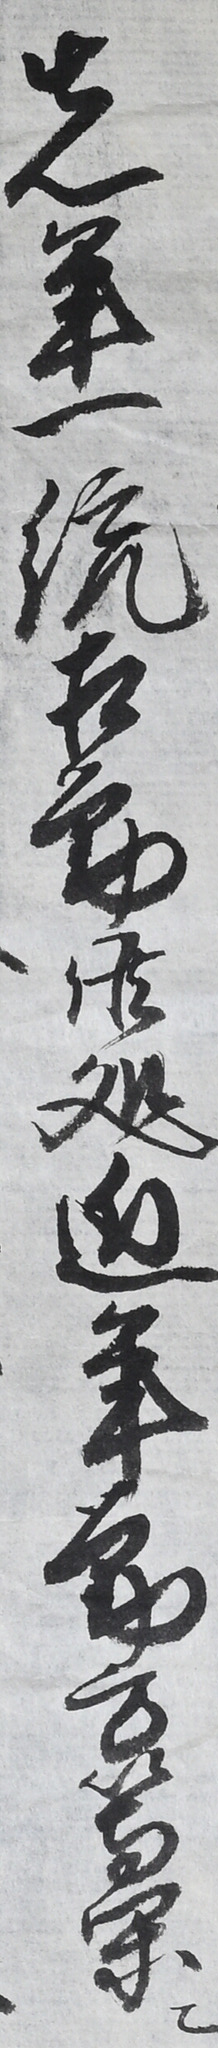先年一統相勤候処近年勤方等閑ニ
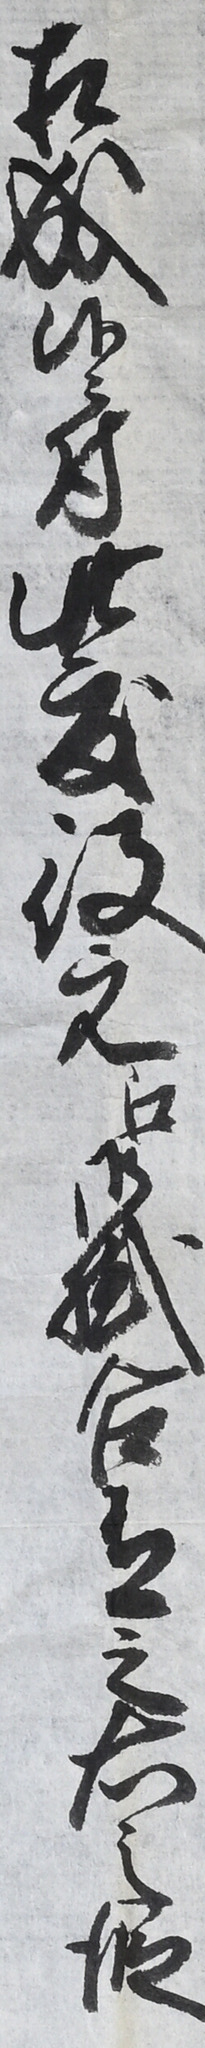相成候ニ付此度役元え御掛合有之右之段
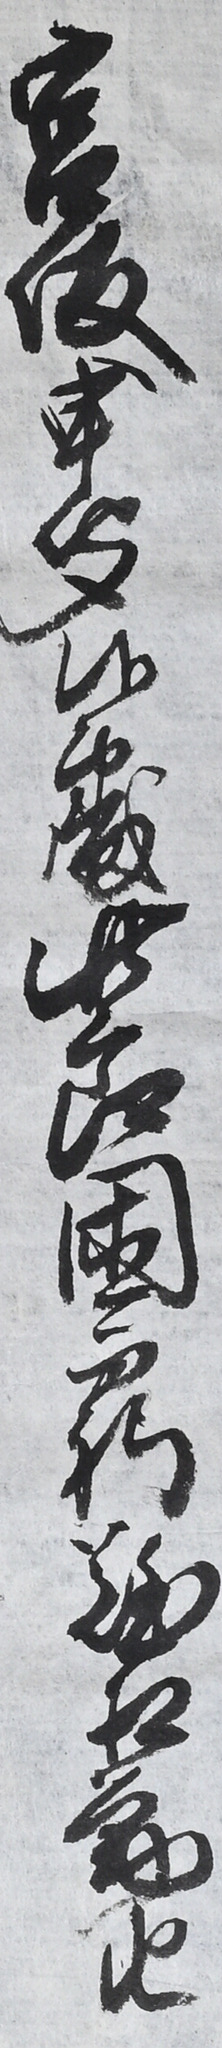宮坂申聞候処此節困窮難相勤由
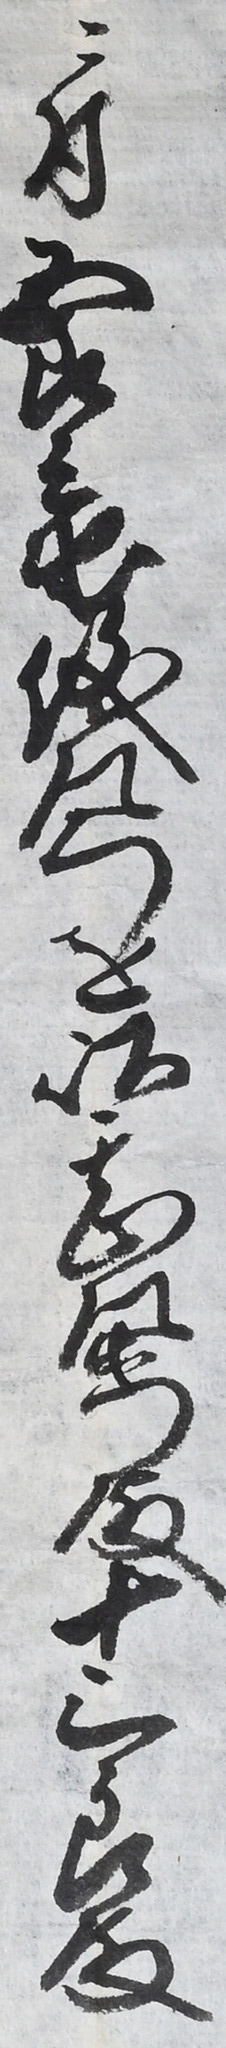ニ付五郎兵衛儀左衛門を以甚左衛門殿十三郎殿
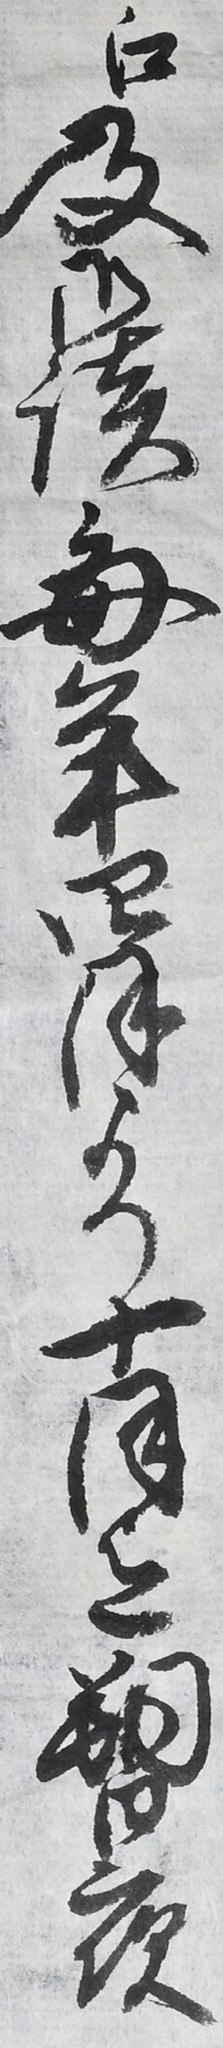え及御談毎年四月より十月迄朔日夜
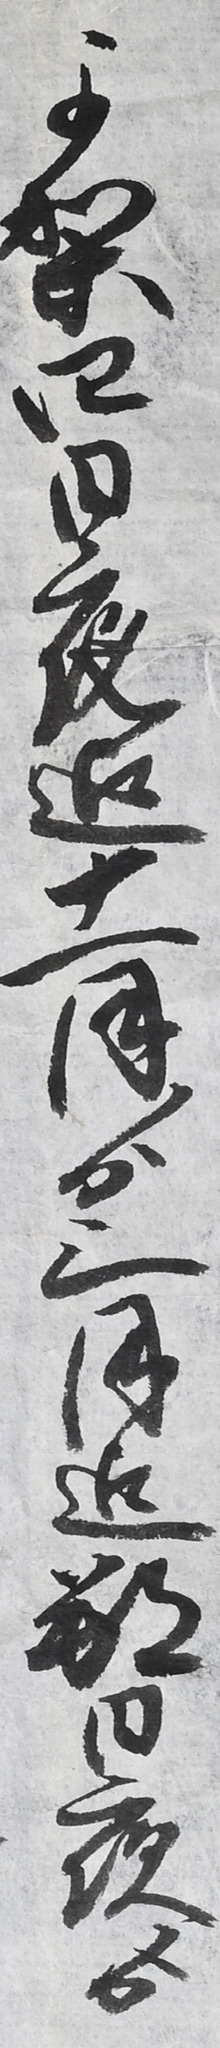より四日夜迄十一月より三月迄朔日夜より
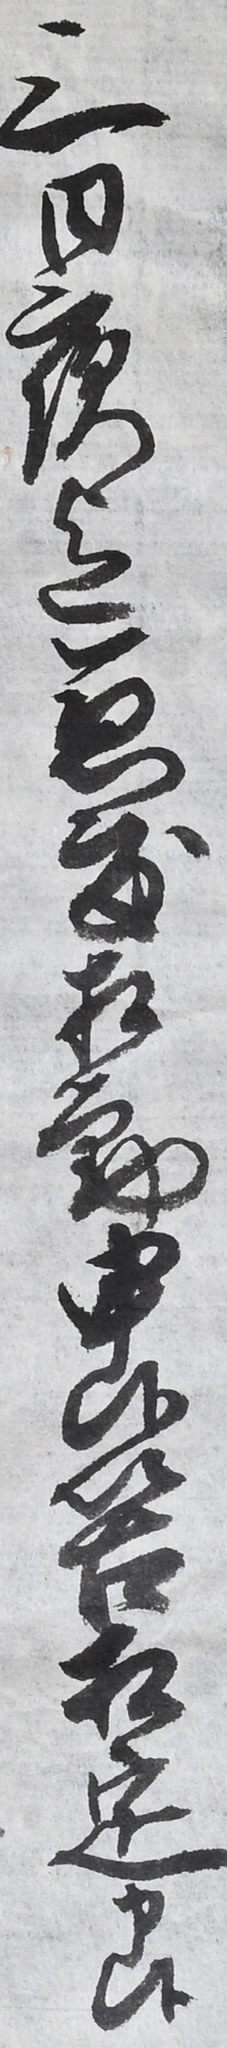三日夜迄急度相勤申候筈相定申候
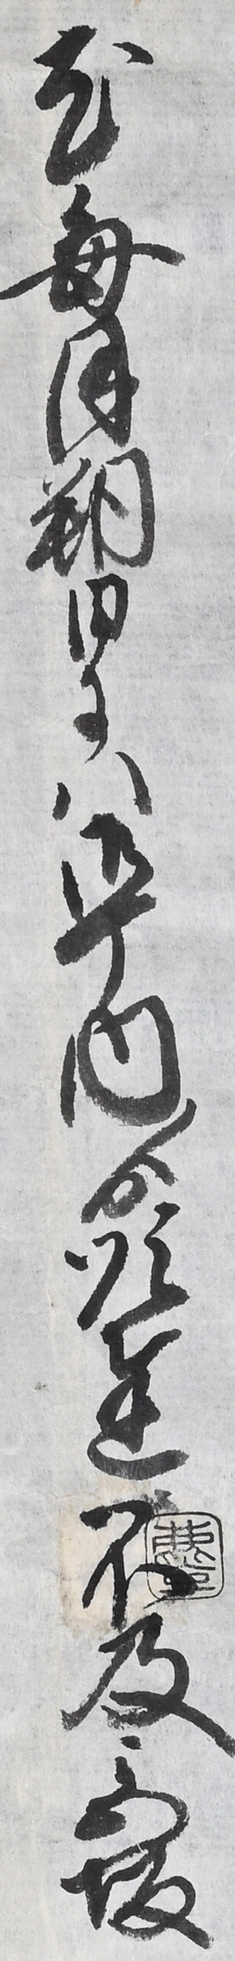尤毎月朔日にハ御町内より順達不及宮坂
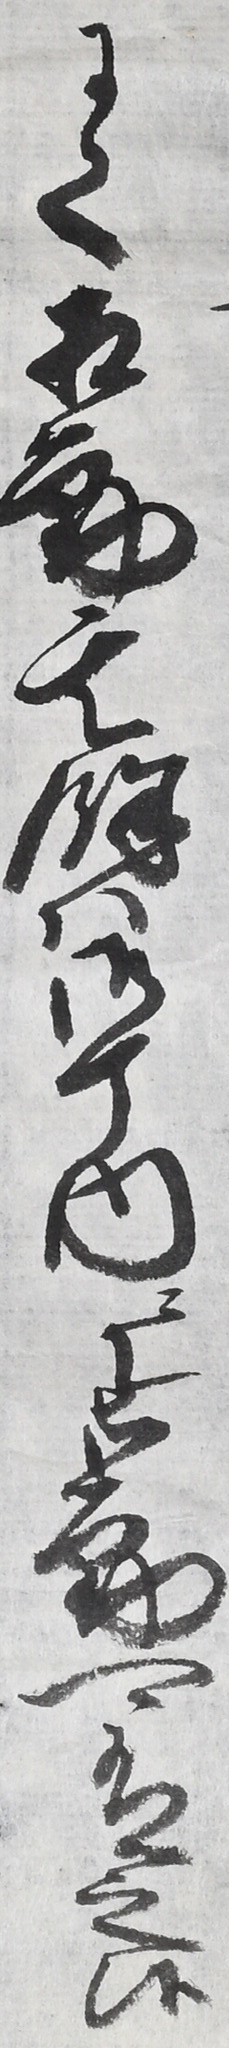にて相勤其余ハ御町内ニて御勤可有之候
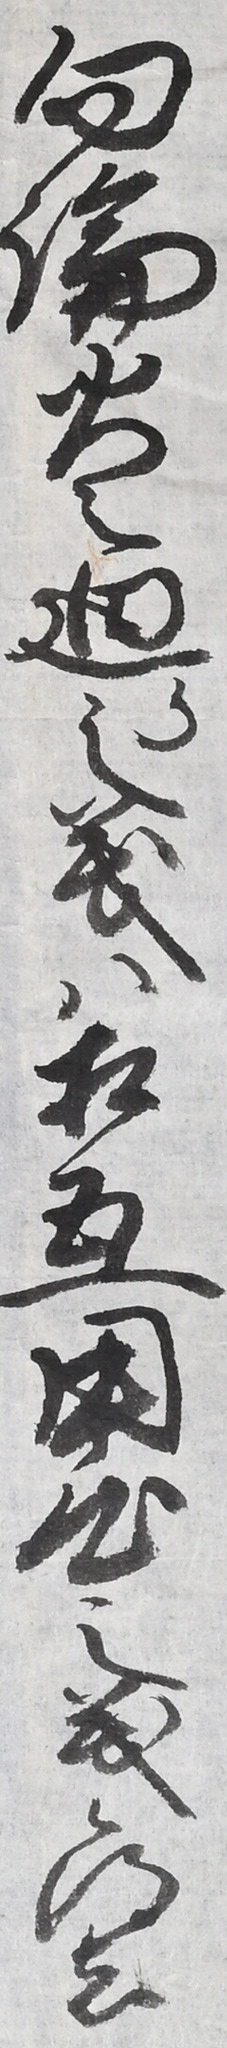勿論火之廻り之義ハ相互用心之義候得は
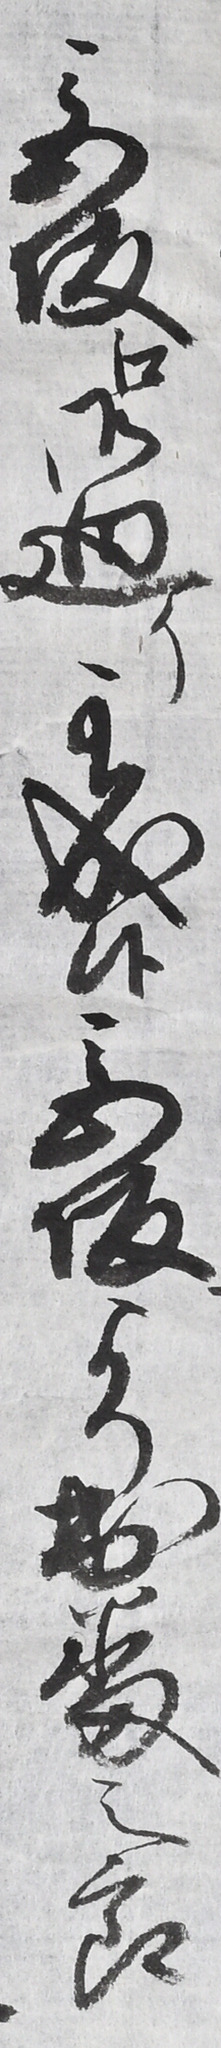宮坂え御廻り可成候宮坂より出番之節
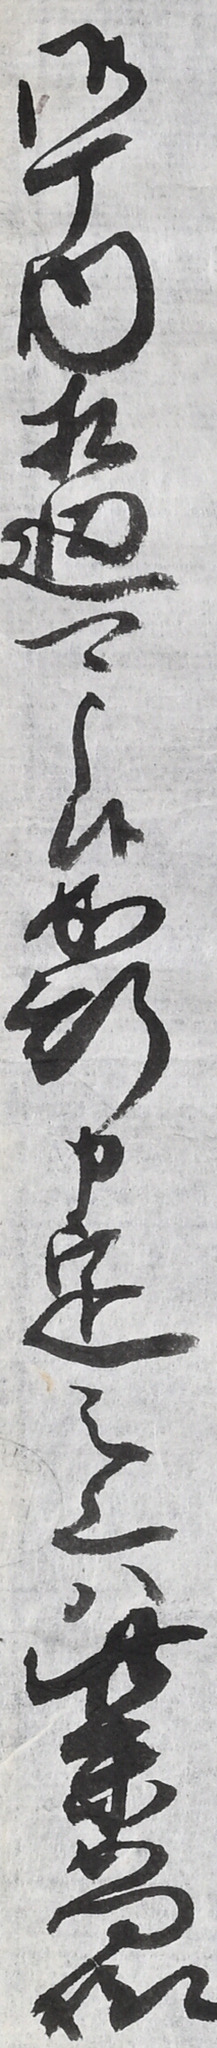御町内相廻可申候如斯申定之上ハ此末如何様
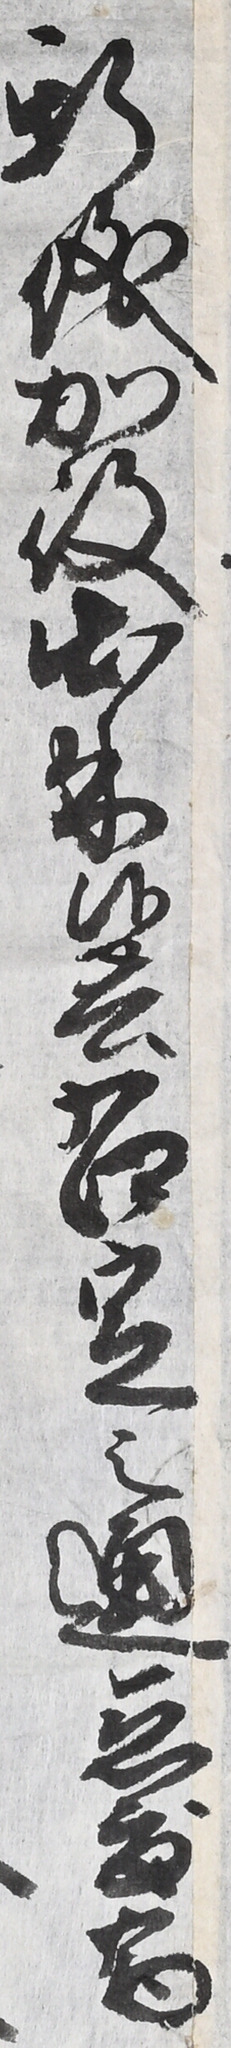新儀加役出来候共右定之通急度為
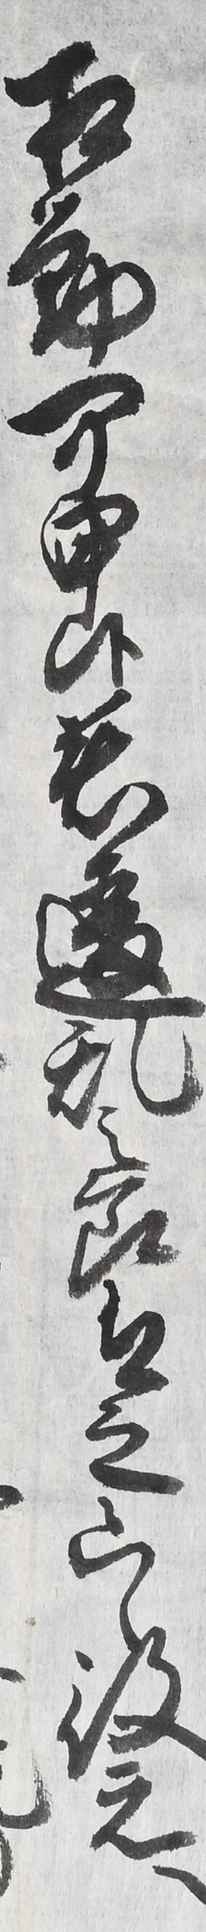相勤可申候若違乱之節有之候ハヽ役元へ
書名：書違一札之事
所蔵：伊那市立高遠町図書館・合同会社AMANE
